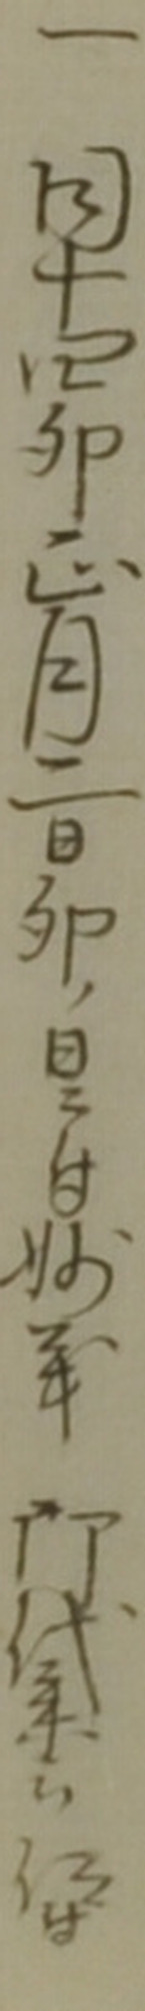一同十四卯正月二日卯ノ日ニ付妙義御代参被仰付
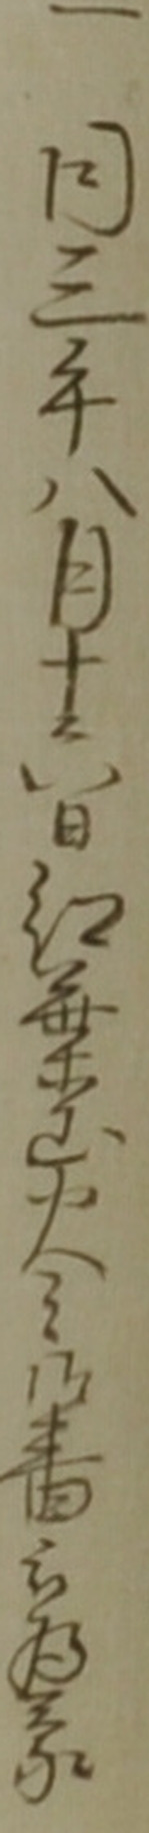一同三午八月十六日紅葉山火之御番被為◻︎
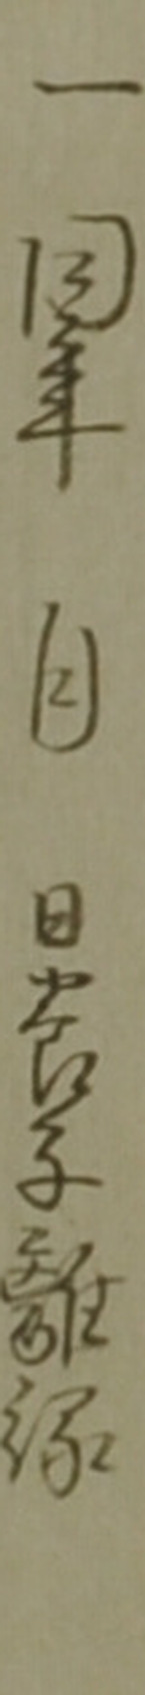一同年月日養子離縁
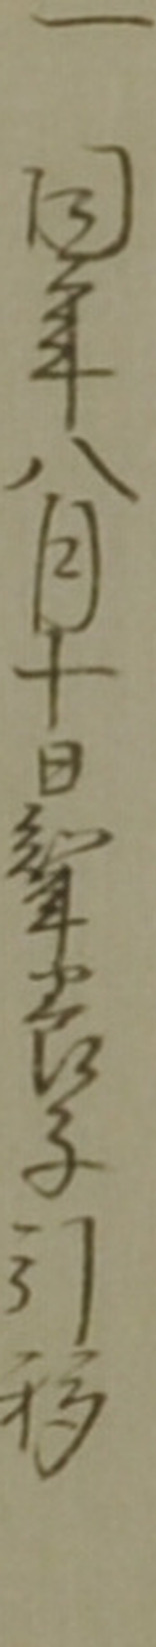一同年八月十日聟養子引移
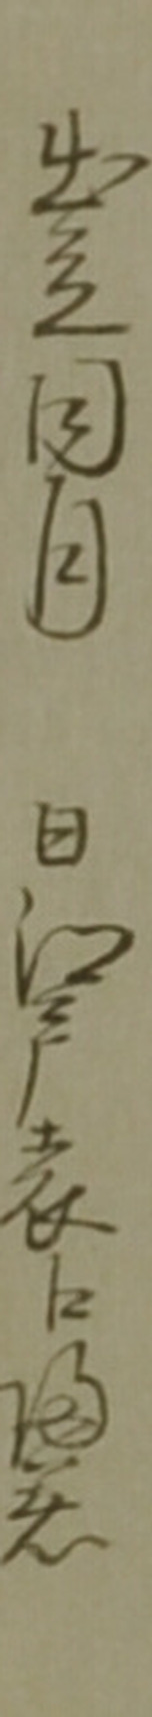出立同月日江戸表江帰着

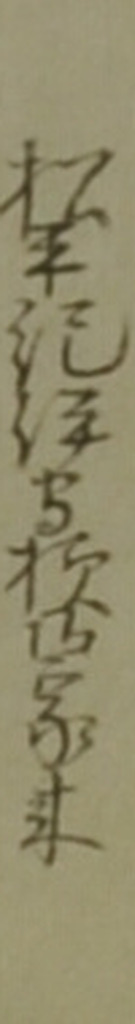松平紀伊守様御家来
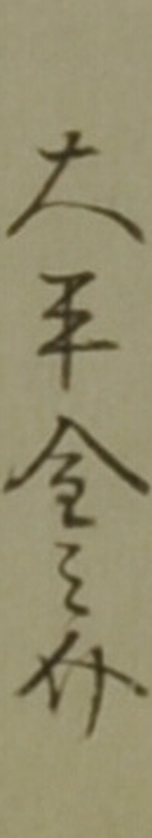大平金之介
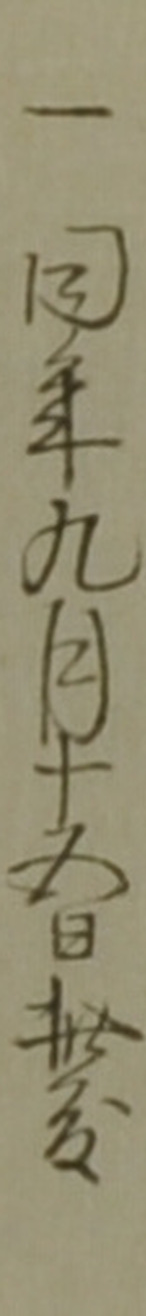一同年九月十五日此度

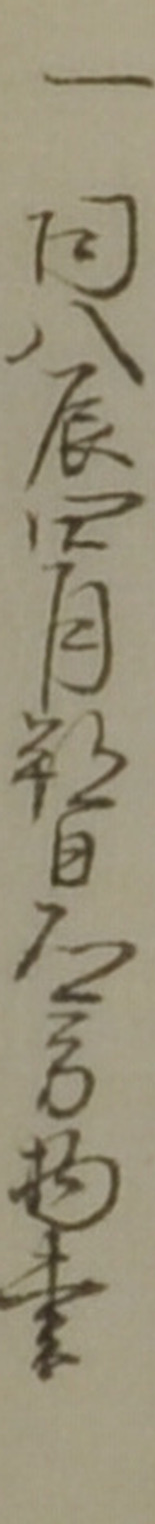一同八辰四月朔日郷方物書
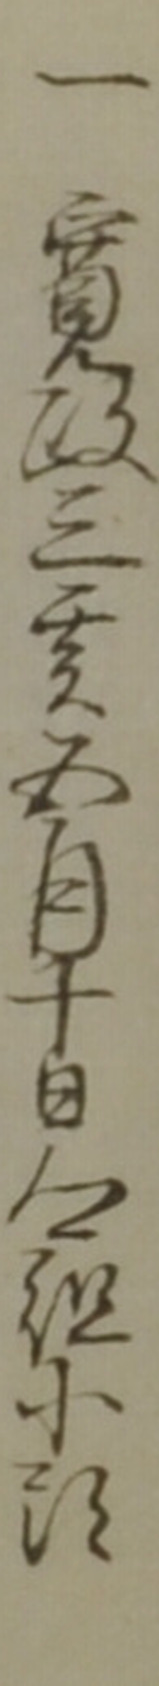一寛政三亥五月十日郷組小頭
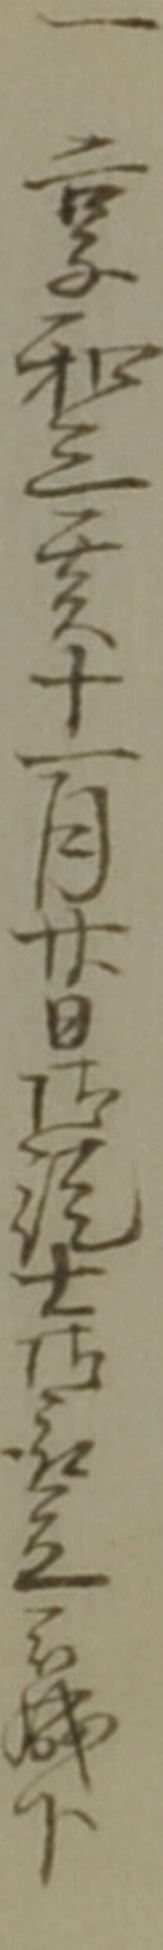一享和三亥十一月廿日御徒士御取立被成下
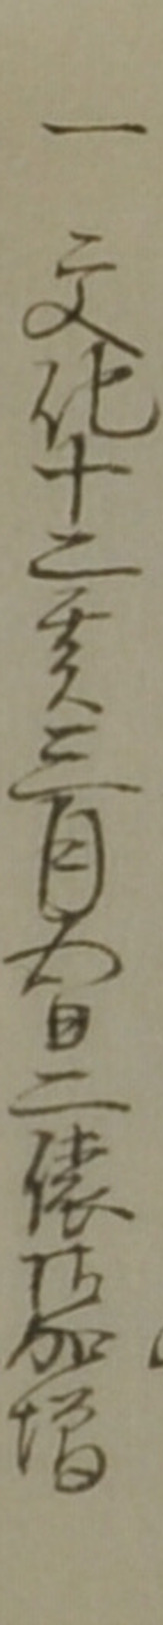一文化十二亥三月五日二俵御加増
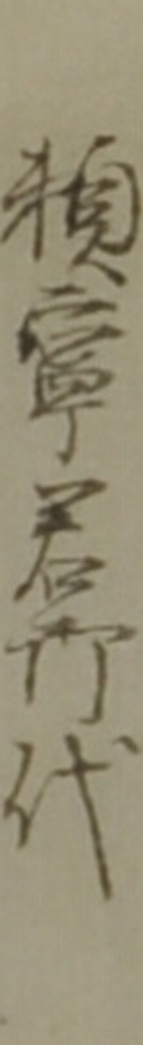頼寧君御代
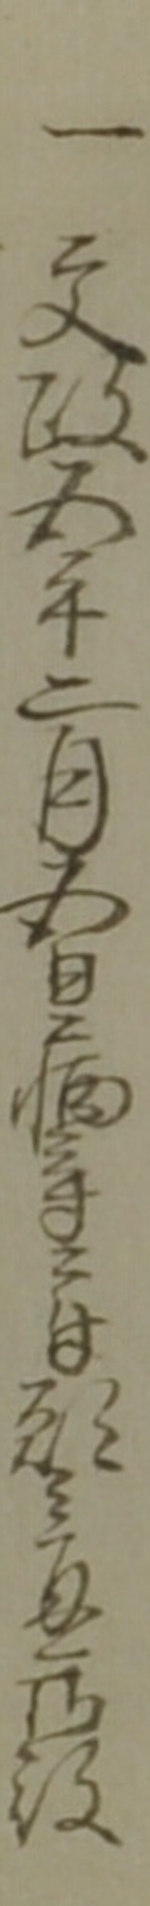一文政五午二月五日病気ニ付願之通御役
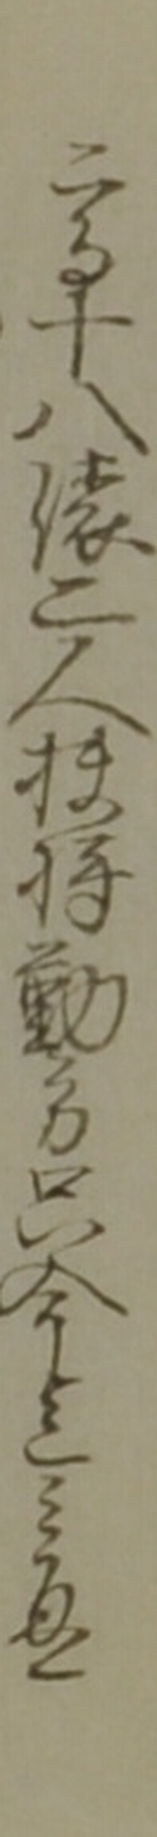高十八俵二人扶持勤方只今迄之通
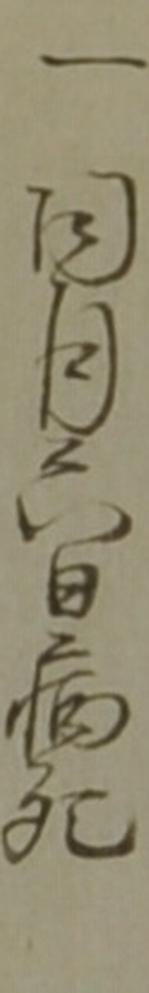一同月六日病死
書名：無足諸士勤仕録（六）
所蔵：伊那市立高遠町図書館・合同会社AMANE
